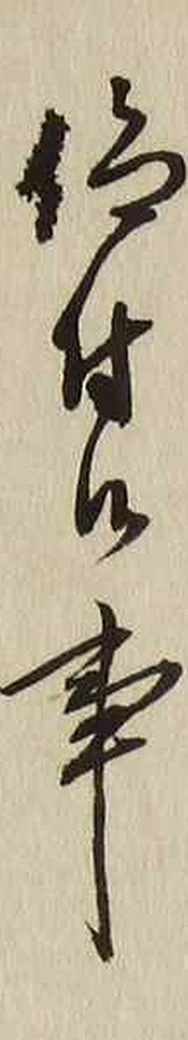仰付候事
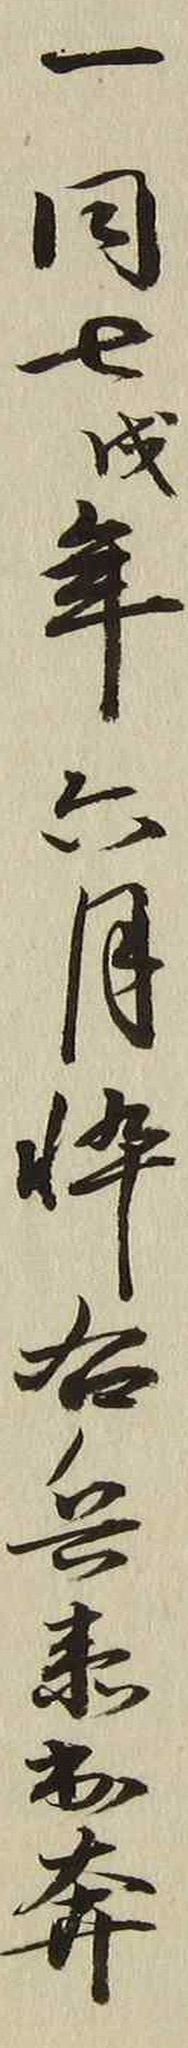一同七戌年六月忰右兵衛出奔
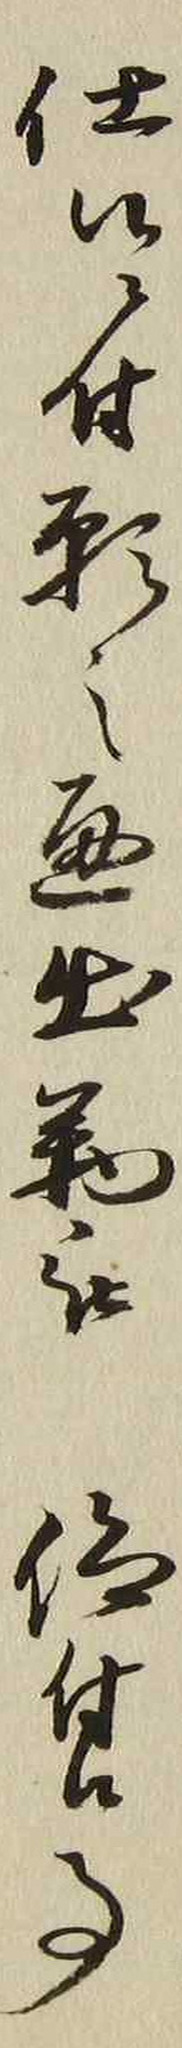仕候ニ願之通出勤被仰付候事
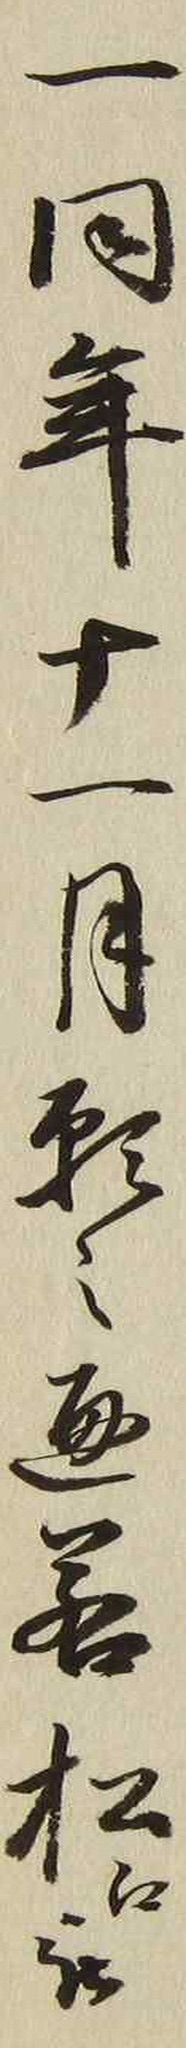一同年十一月願之通若松江被
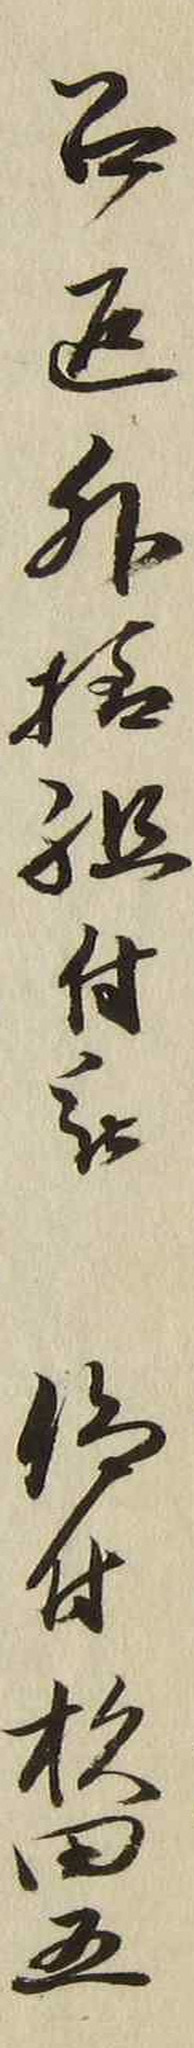召返外様組付被仰付杉田五
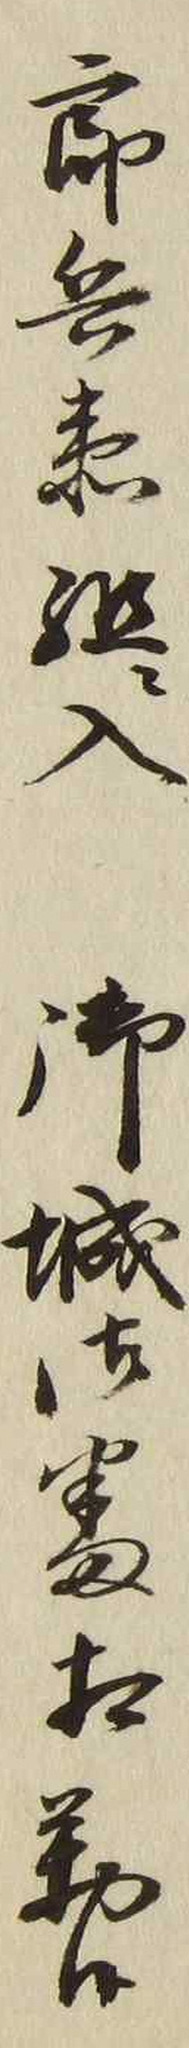郎兵衛組ニ入御城御番相勤候

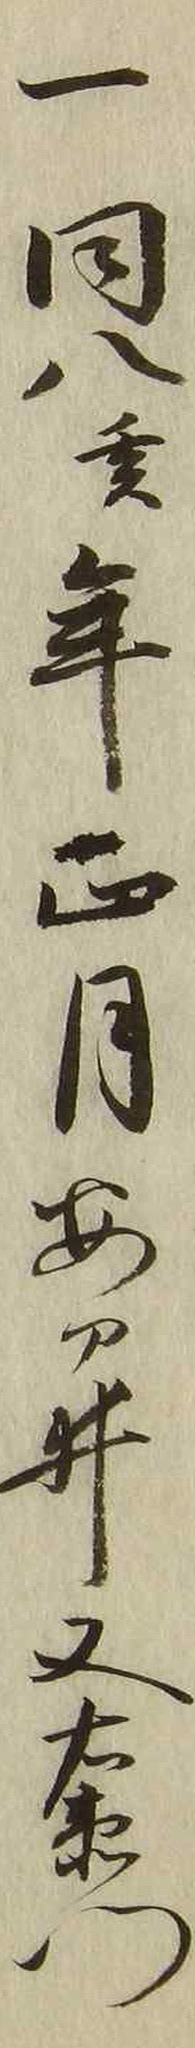一同八亥年正月安部井又右衛門
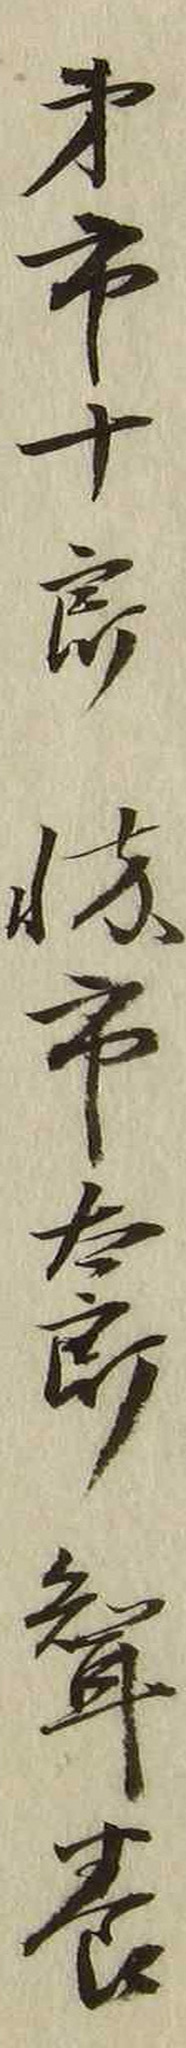弟市十郎忰市太郎婿養
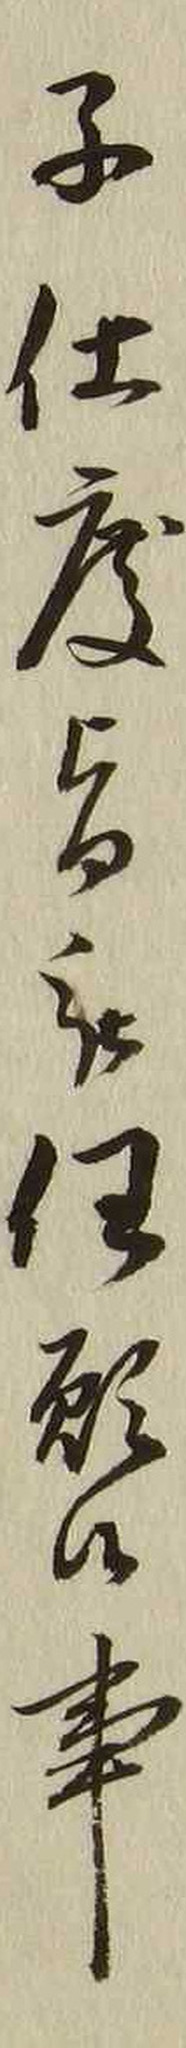子仕度旨被任願候事
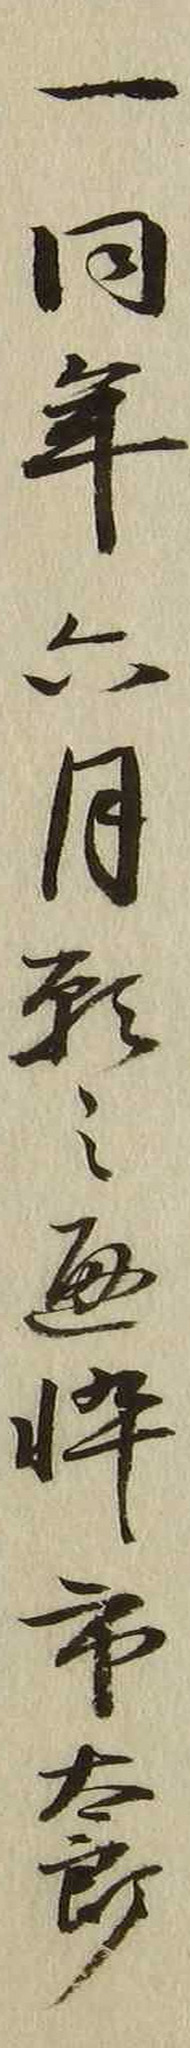一同年六月願之通忰市太郎
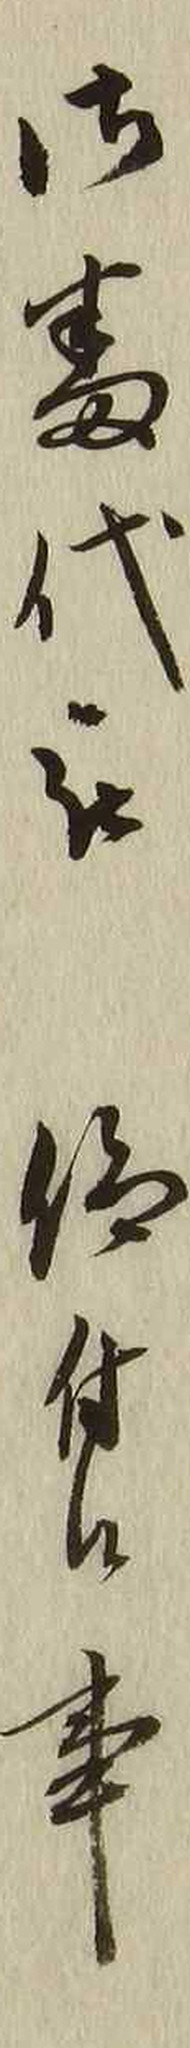御番代被仰付候事
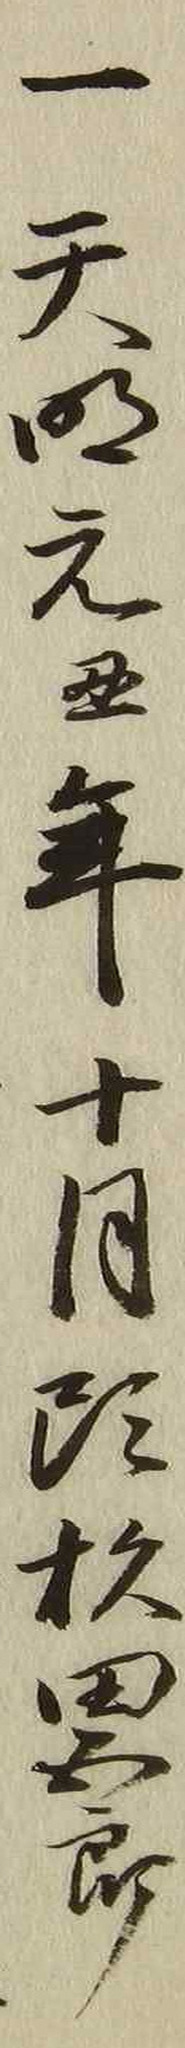一天明元丑年十月頭杉田五郎
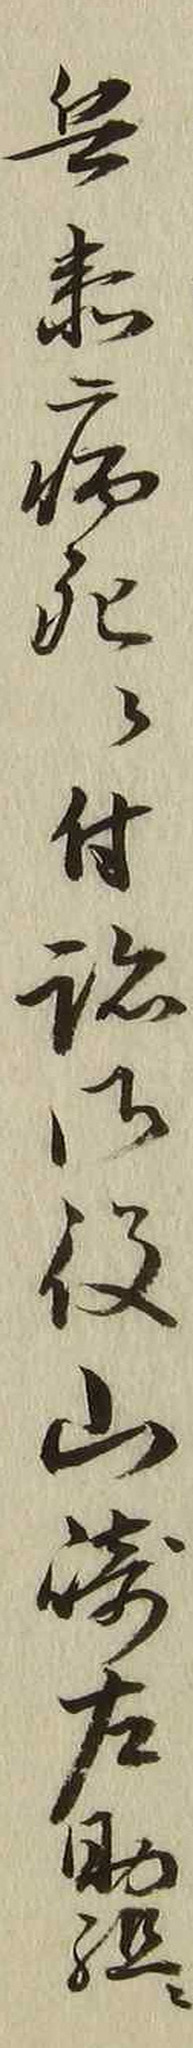兵衛病死ニ付跡御役山崎左助組ニ
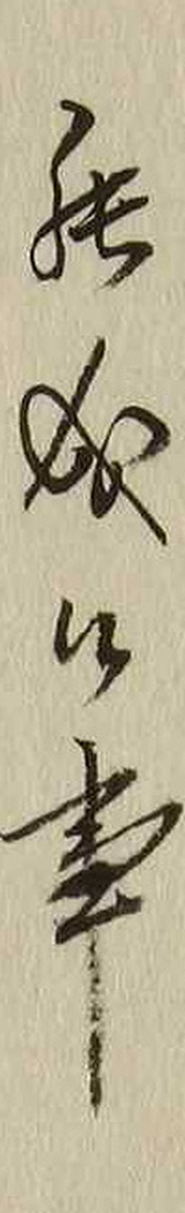罷成候事
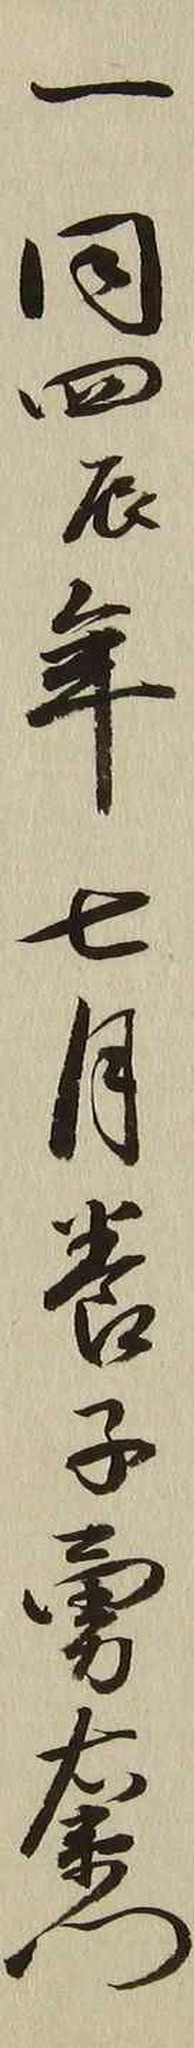一同四辰年七月養子勇右衛門
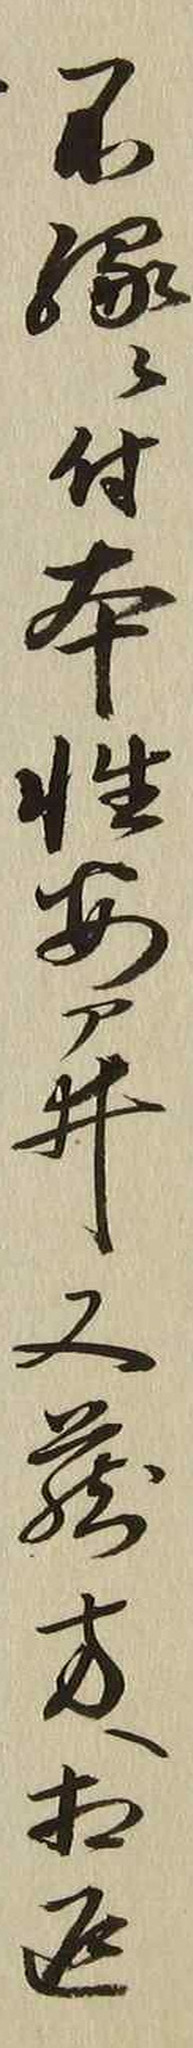不縁ニ付本性安部井又蔵方へ相返
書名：諸士系譜　巻之61　と之部4
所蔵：会津若松市立会津図書館
